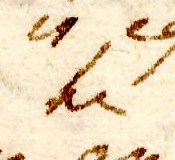be
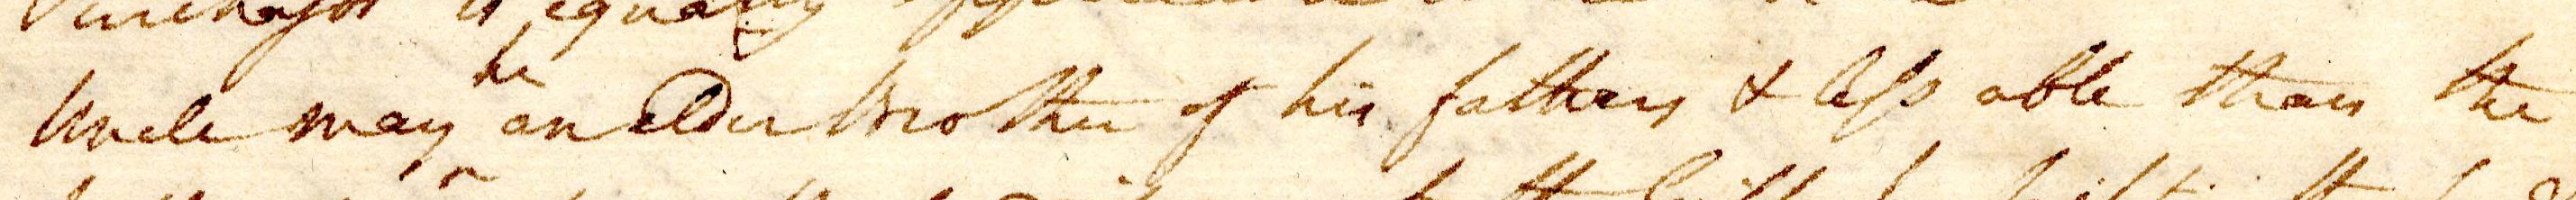Uncle may ^ an elder brother of his fathers & Also able than the
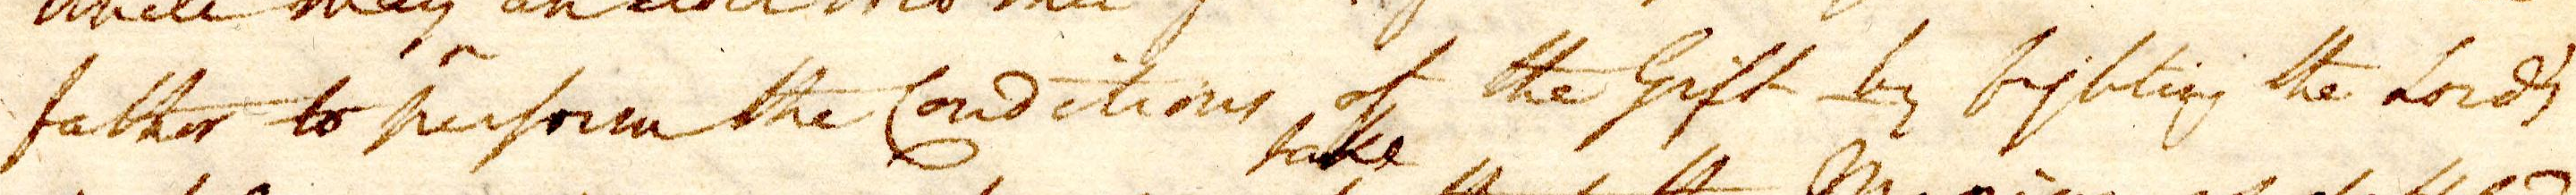father to perform the Conditions of the Grift by fighting the Lords
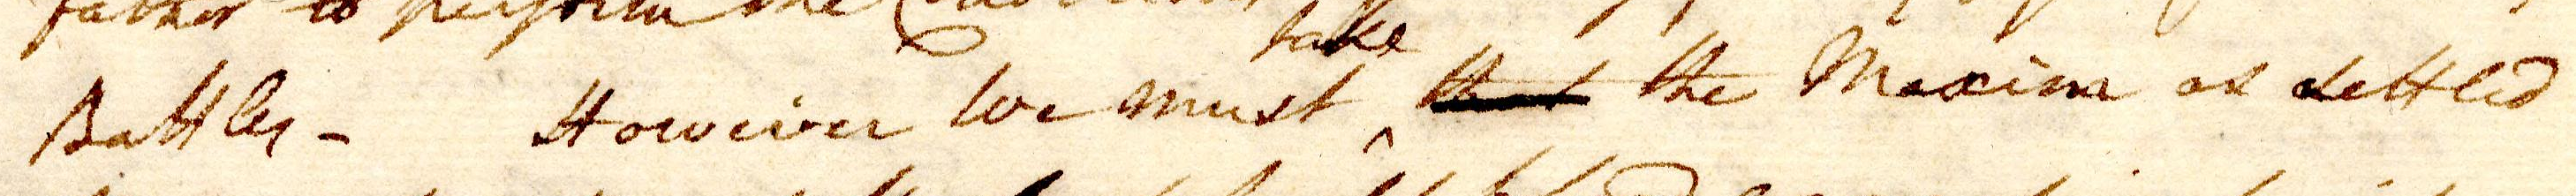Battles. However we must ^ that the Maxim as Settled
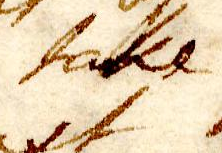take
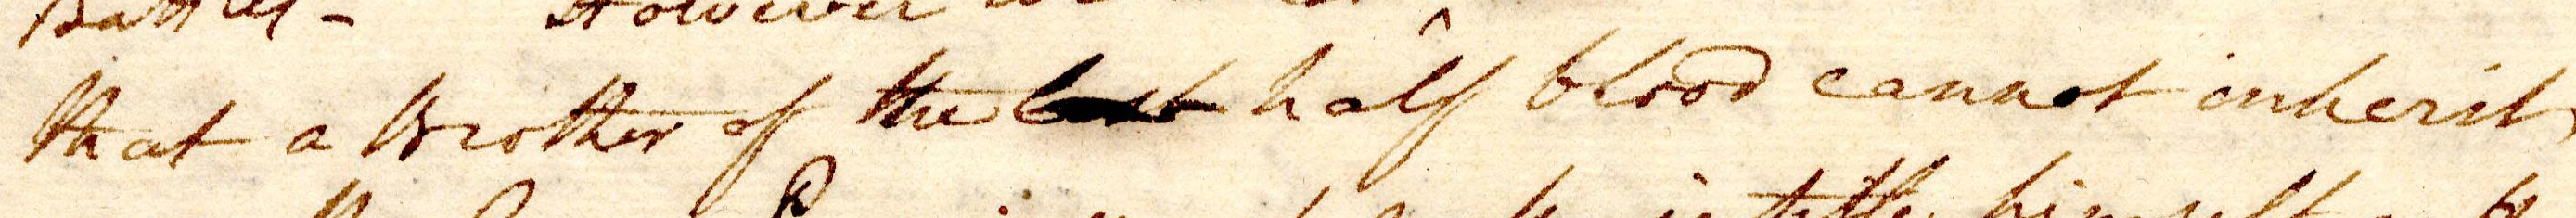that a Brother of the last half blood cannot inherit
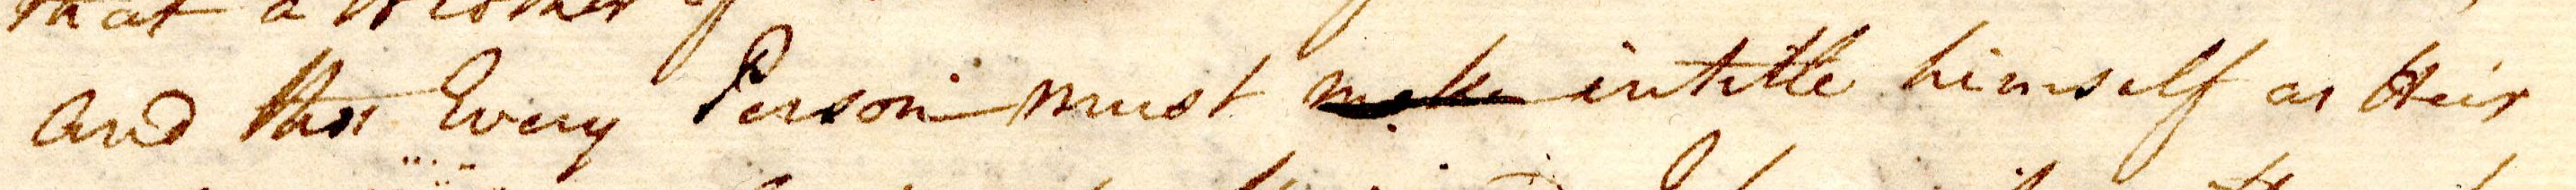and this Every Person must make intitle himself as Heir
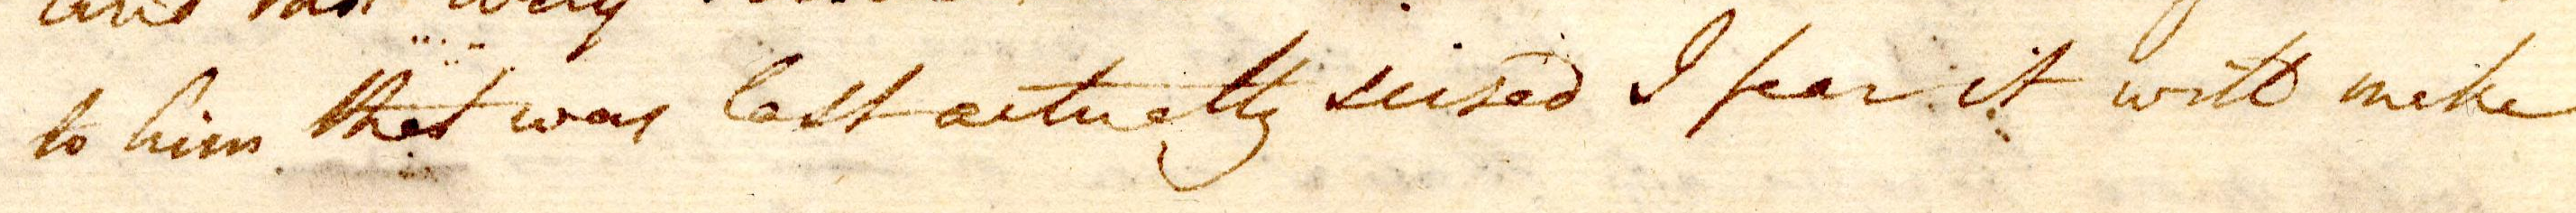to him that was last actually seised I fear it will make
